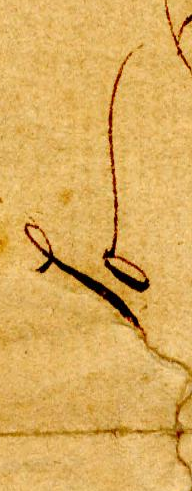To
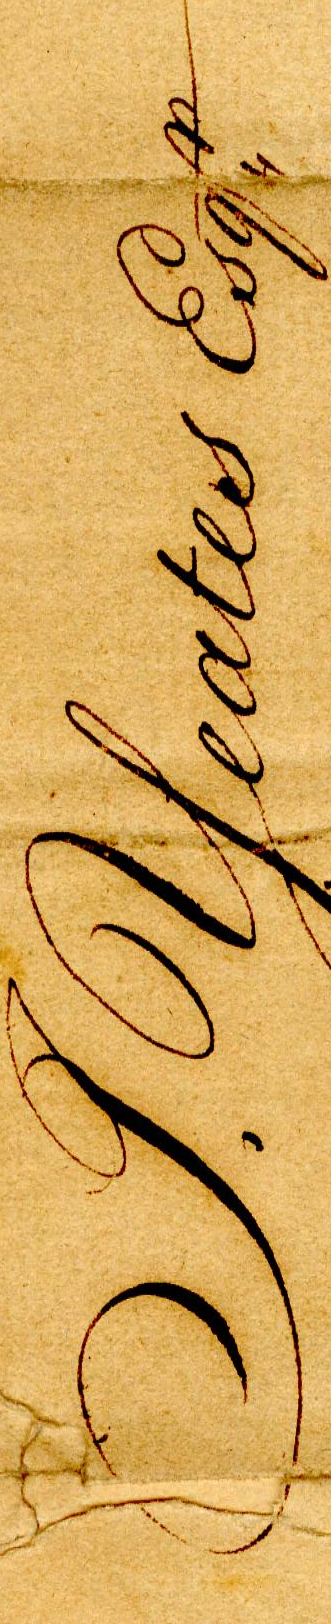J. Yeates Esq^r.
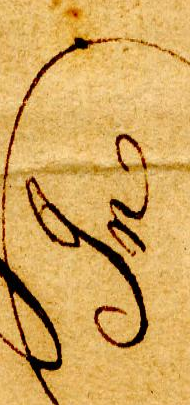In
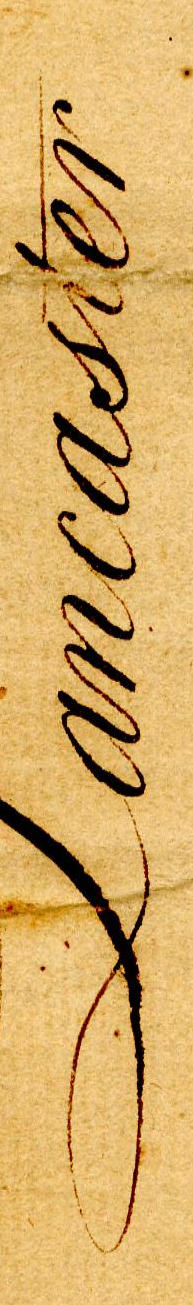Lancaster
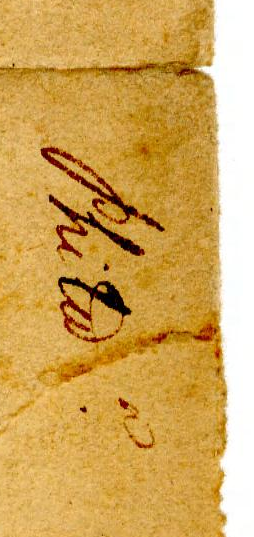Philad^a.
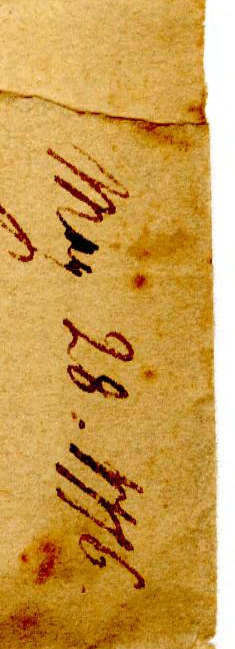May 28. 1776
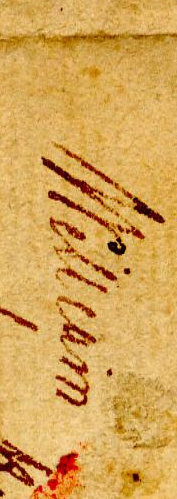William
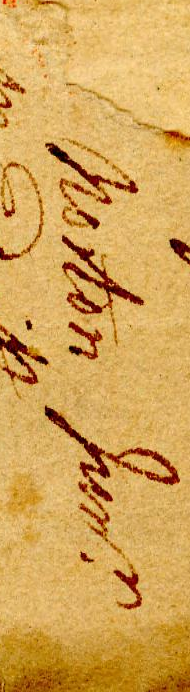Norton Jun^r.
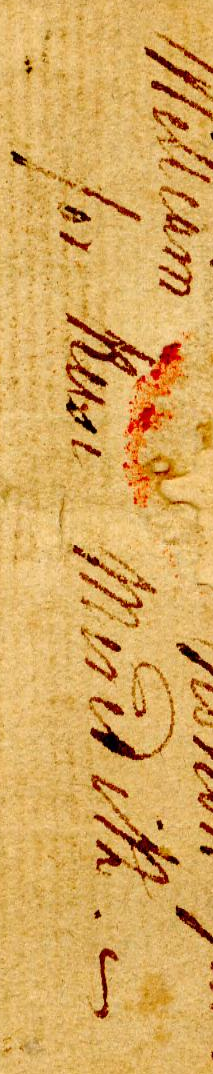for Reese Meredith.-
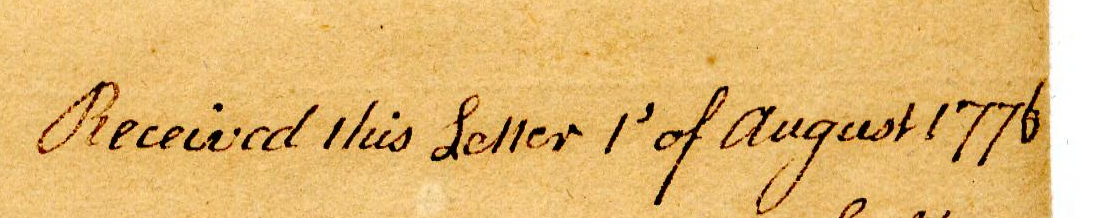Received this Letter 1' of August 1776
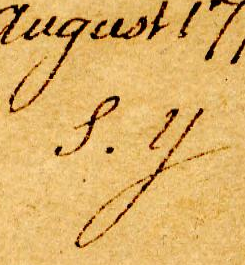J. Y
